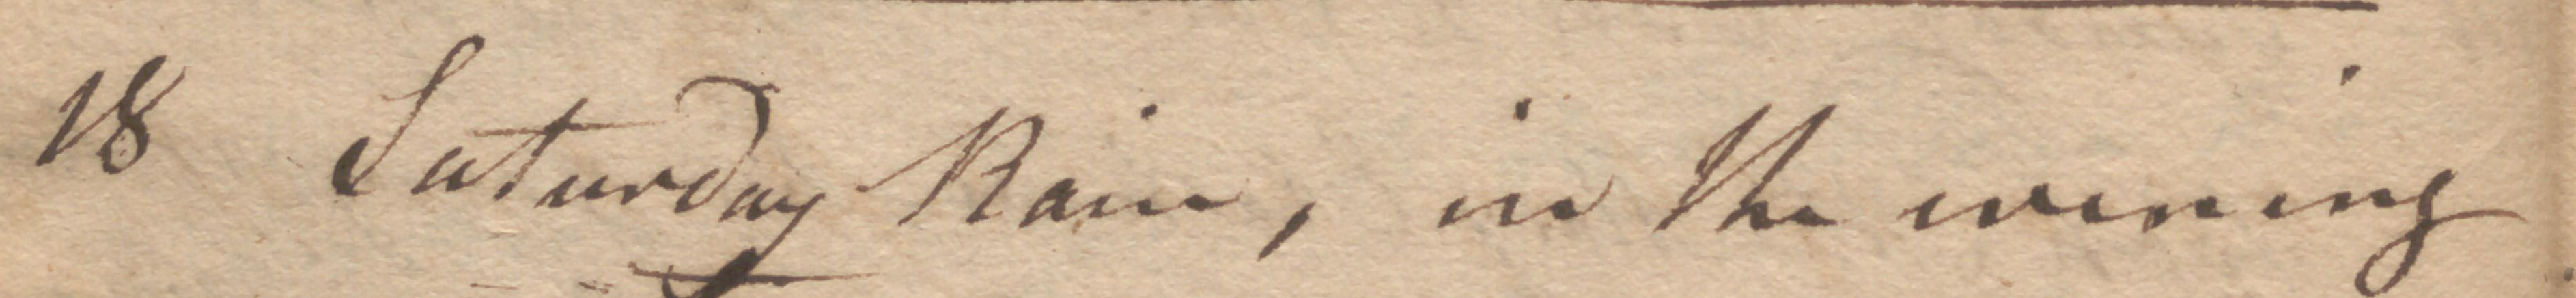18 Saturday Rain, in the evening
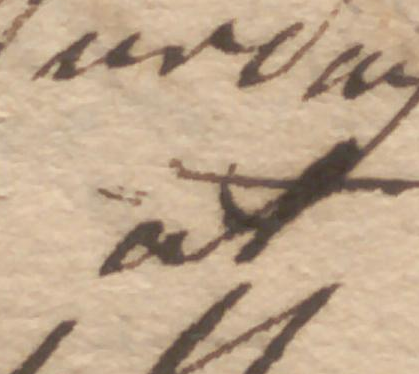at
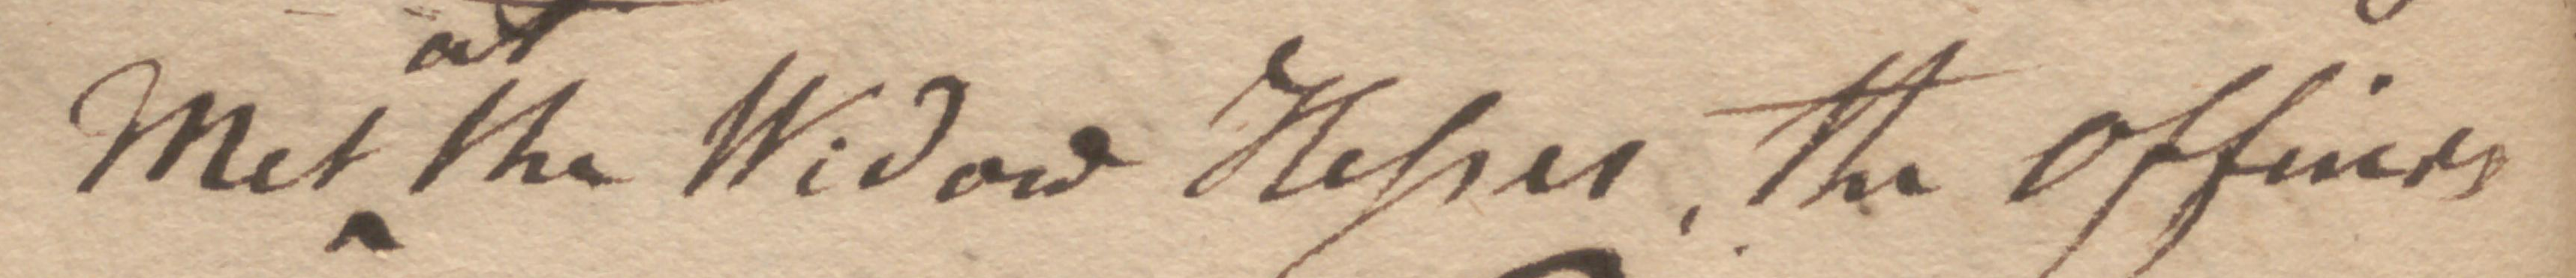Met ^ the Widow Hesses, the officers
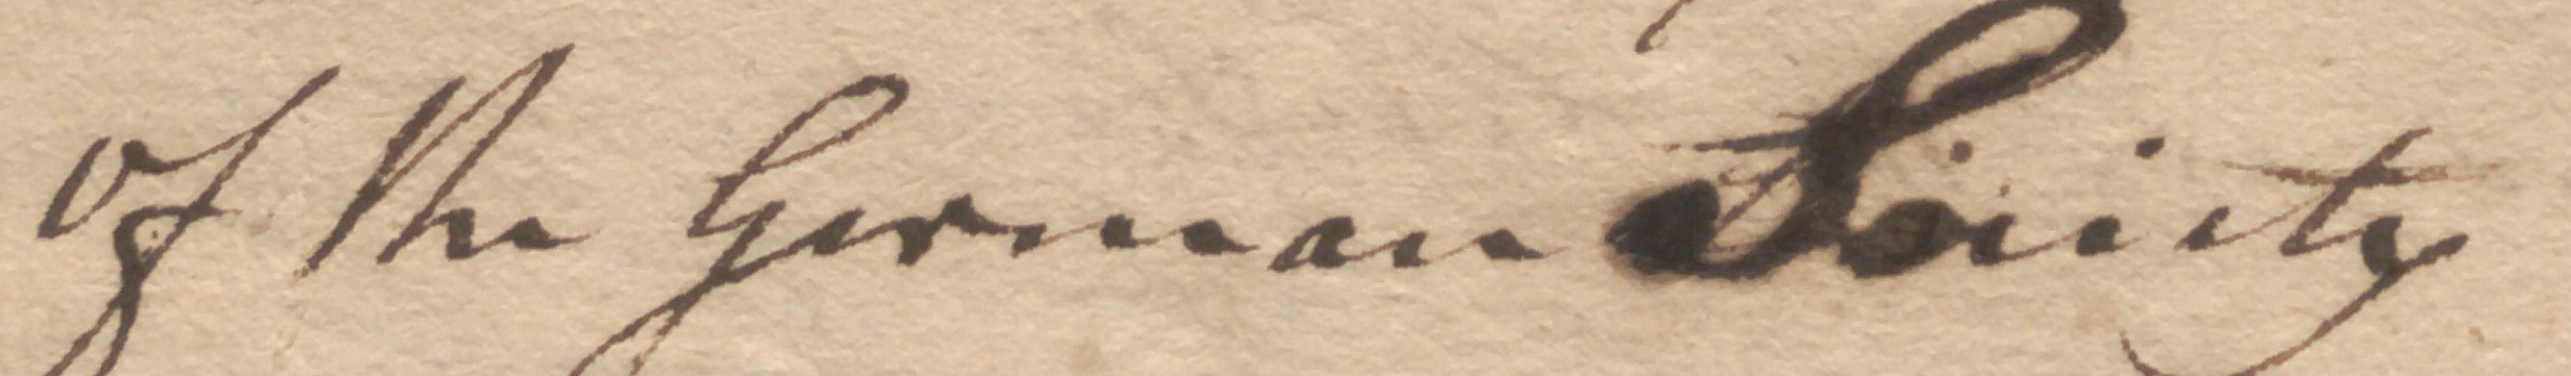of the German Society
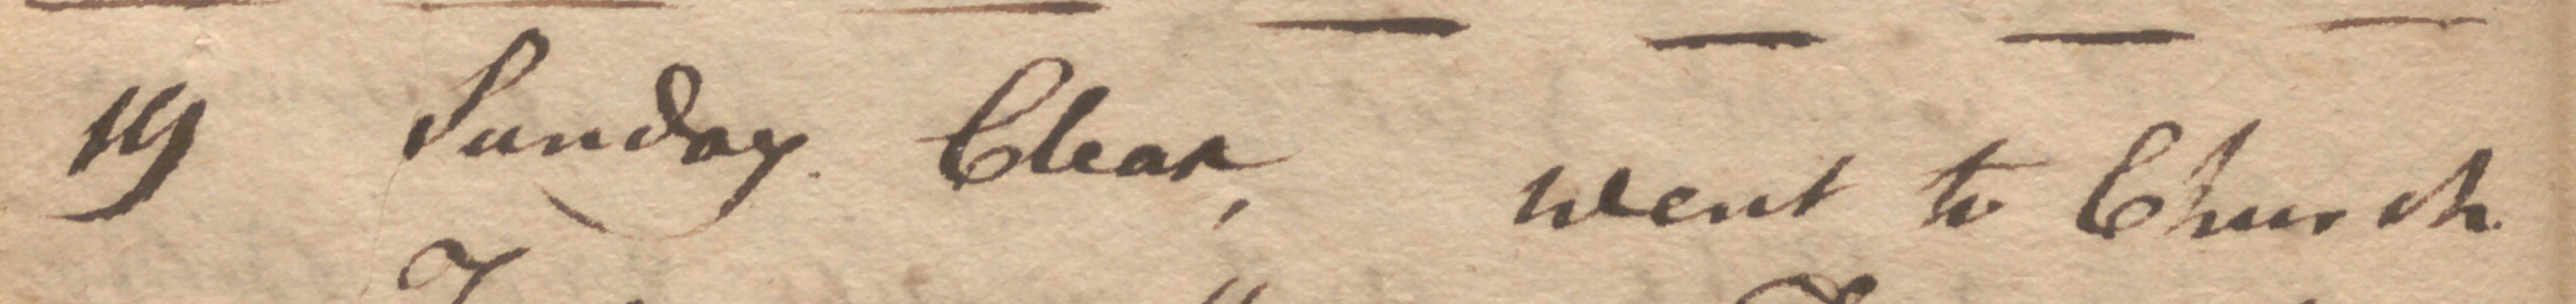19 Sunday. Clear, went to Church
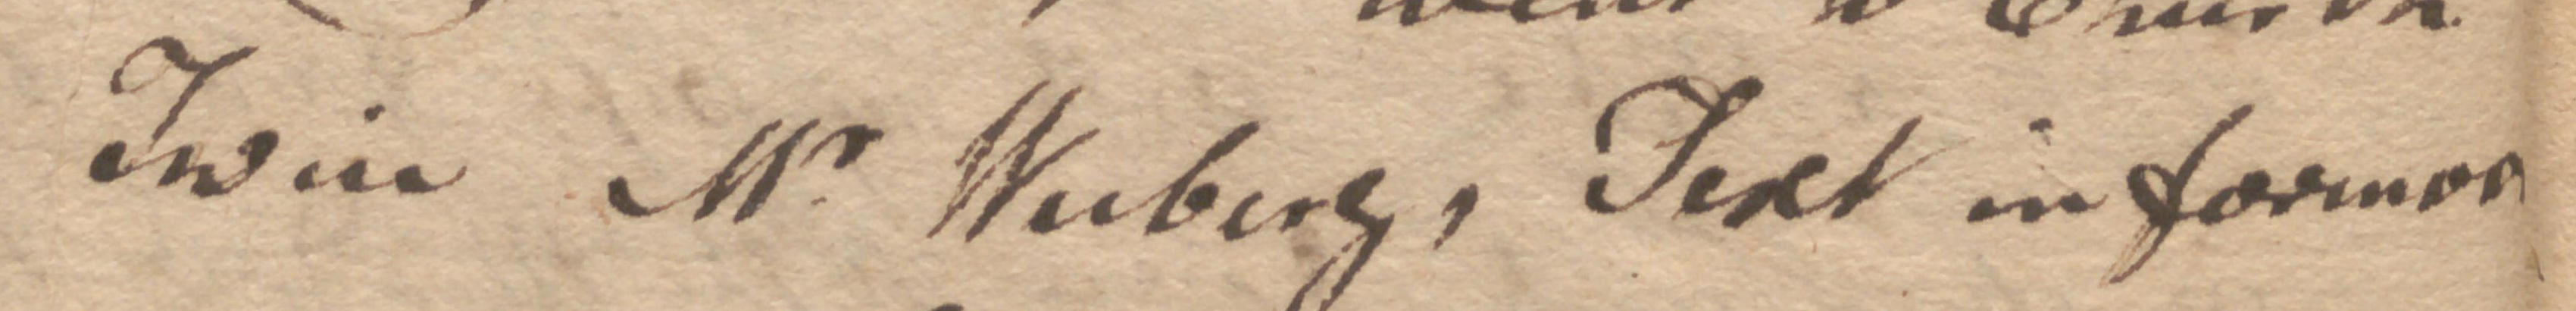Twice M^r. Weibergs Text in fornoon
